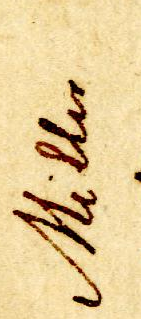Miller
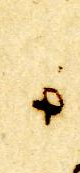&
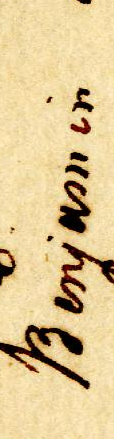Benjamin
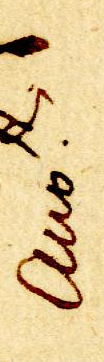Ans^d.
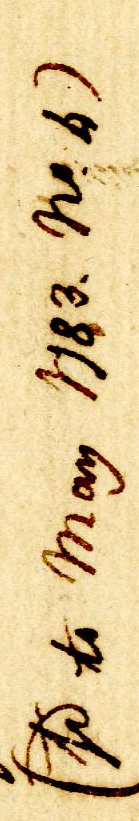(to to May 1783 N^o. 4)
